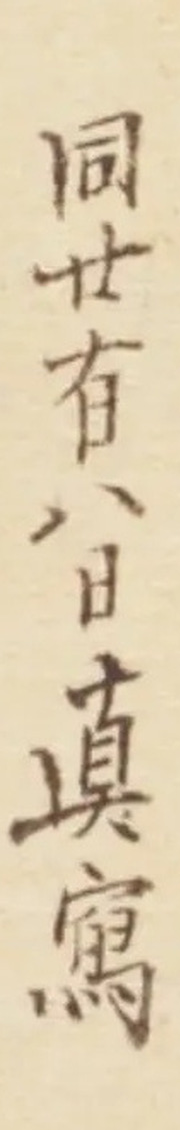同廿有八日真寫

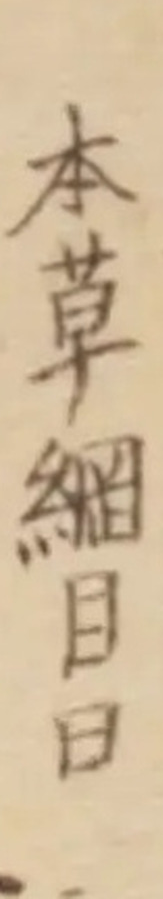本草綱目曰
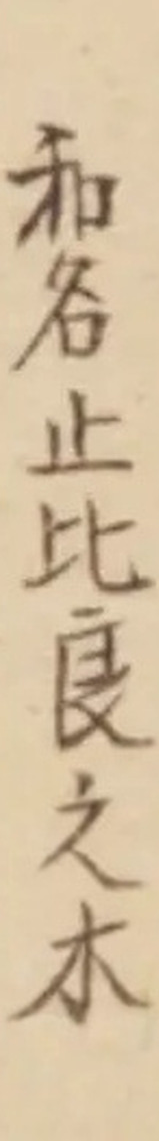和名止比良之木
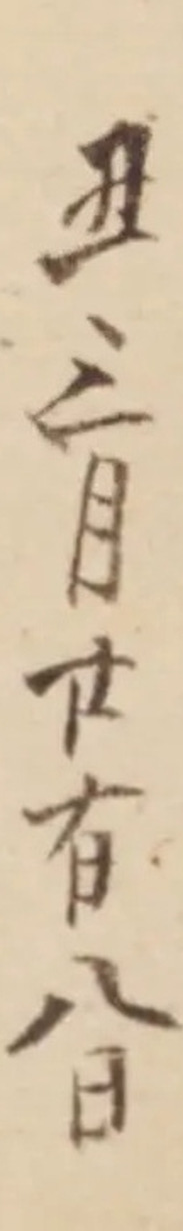丑三月廿有八日
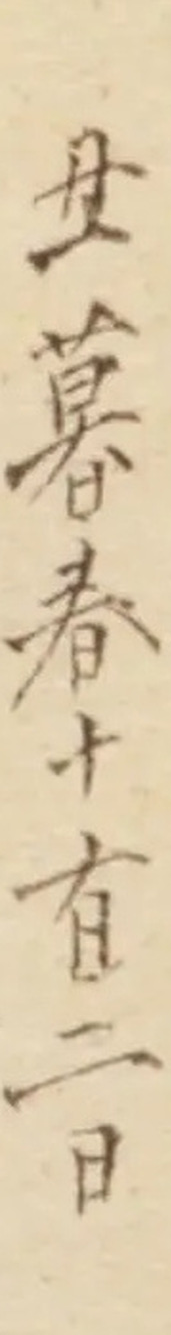丑暮春十有二日
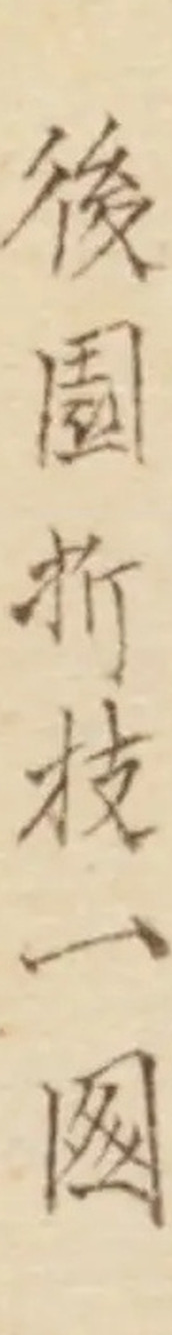後園折枝一圖

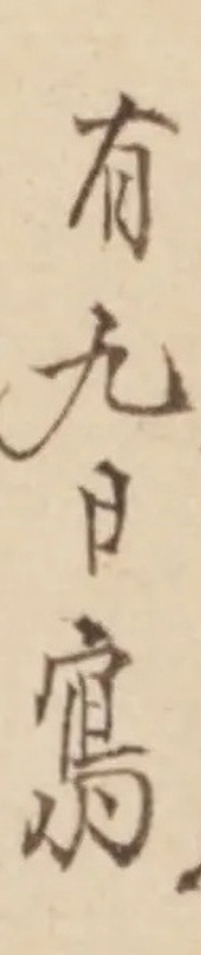有九日寫
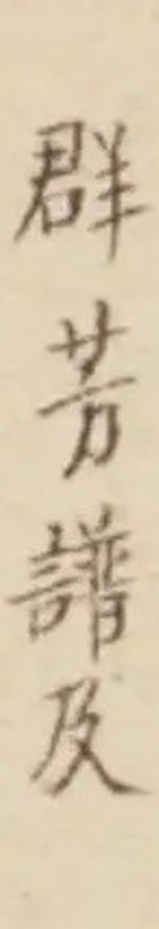群芳譜及

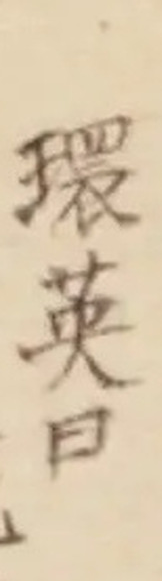環英曰
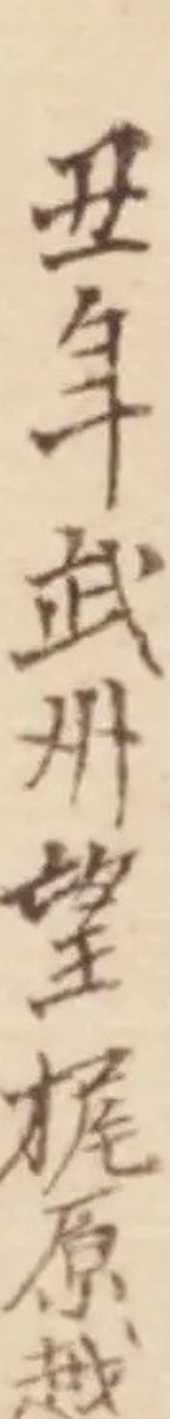丑年武州望梶原越
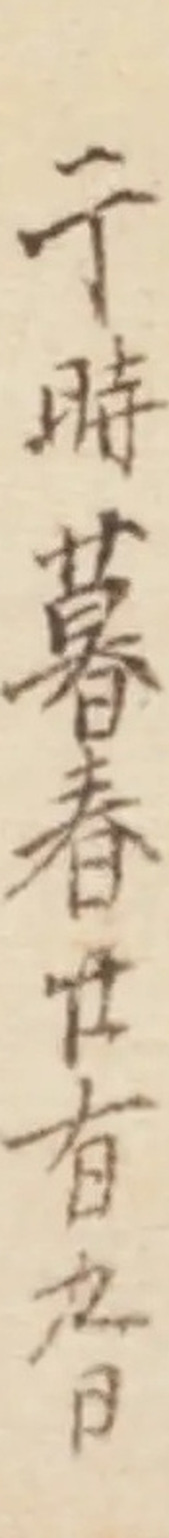亍時暮春廿有九日
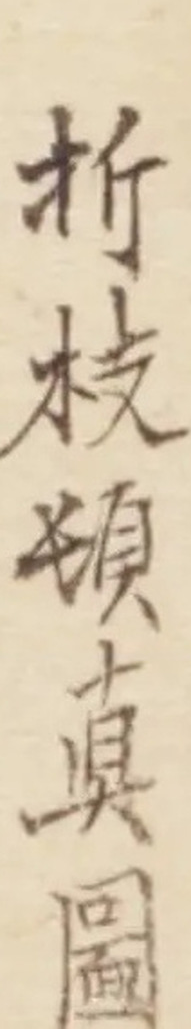折枝頓真圖

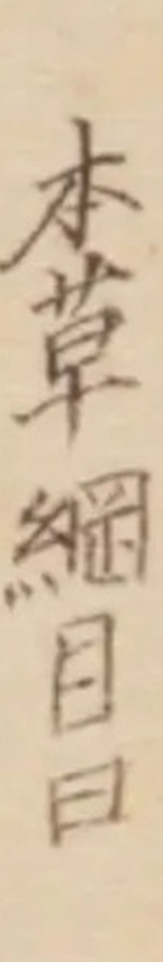本草綱目曰
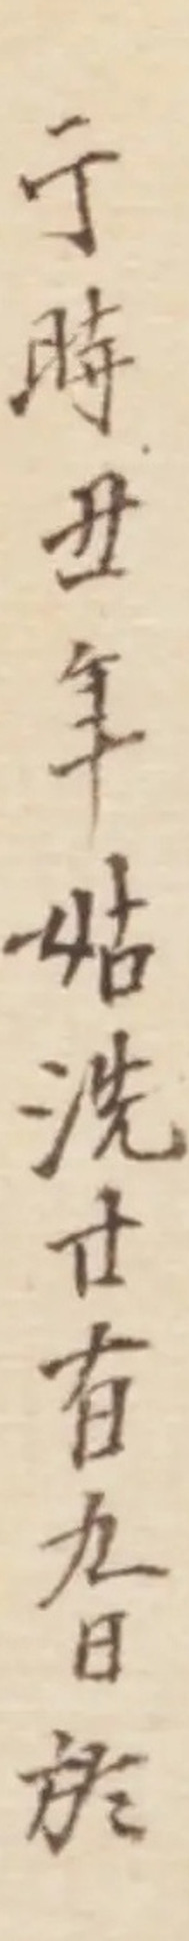亍時丑年姑洗廿有九日於
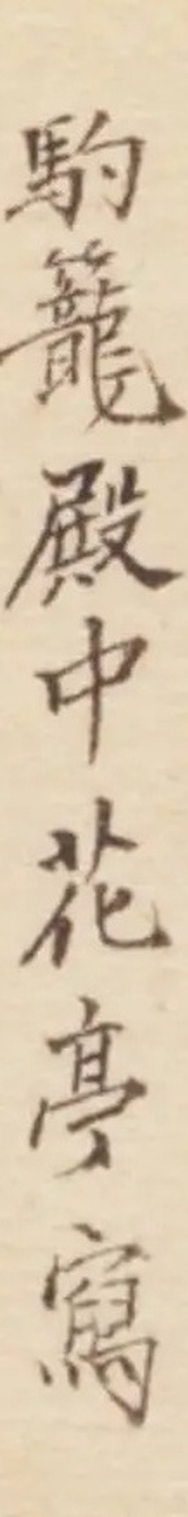駒籠殿中花亭寫

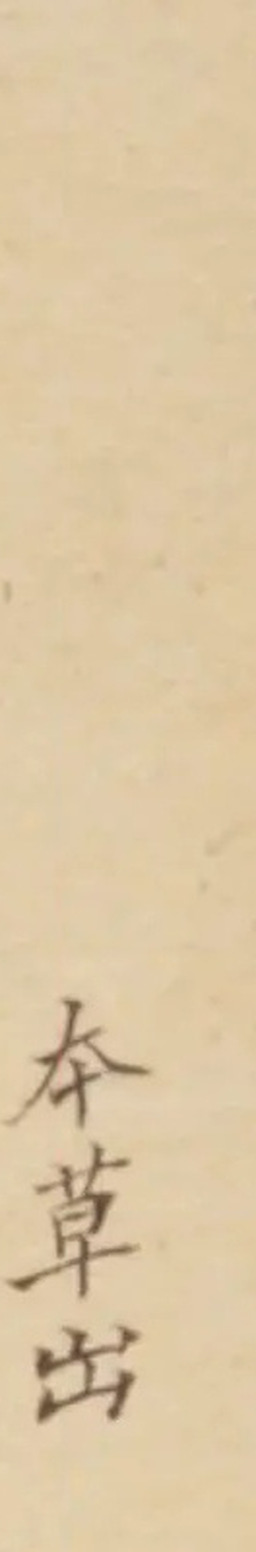本草出
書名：梅園草木花譜春之部. 4
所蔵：国立国会図書館 National Diet Library, JAPAN
